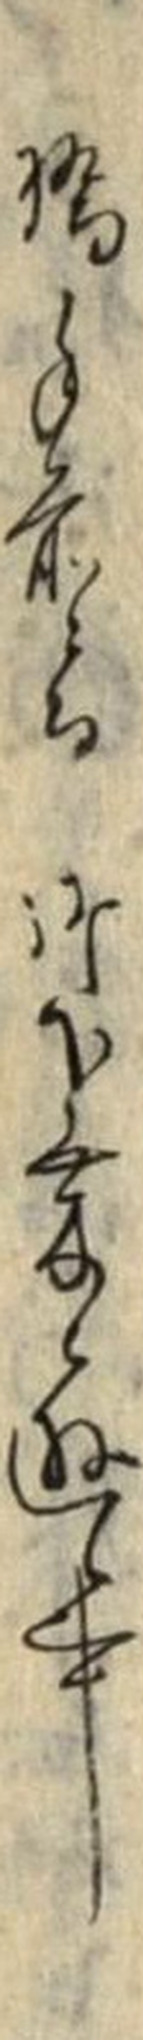橋手前にて御下乗被遊候事

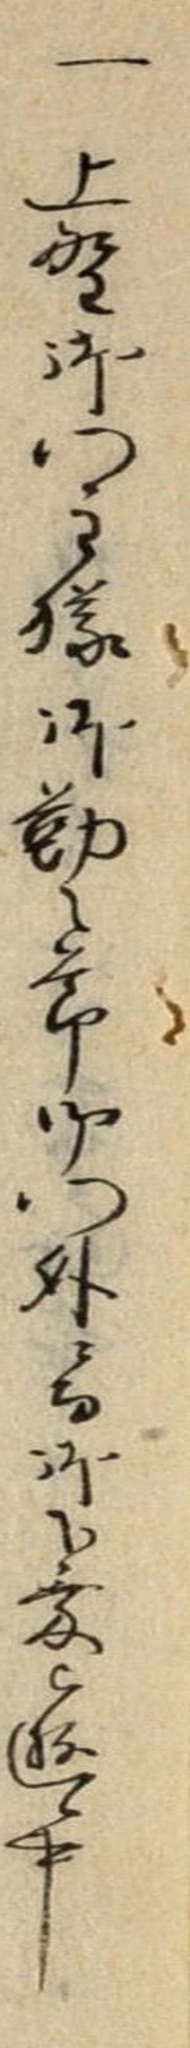一上野御門主様御勤之節御門外にて御下乗被遊候事
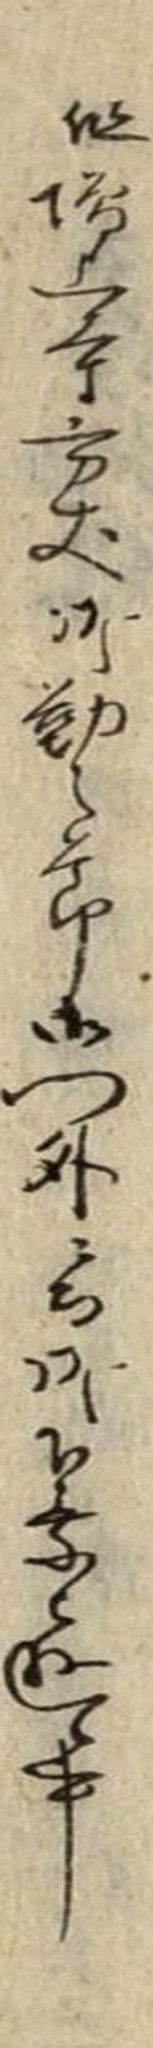但増上寺方丈御勤之節御門外にて御下乗被遊候事
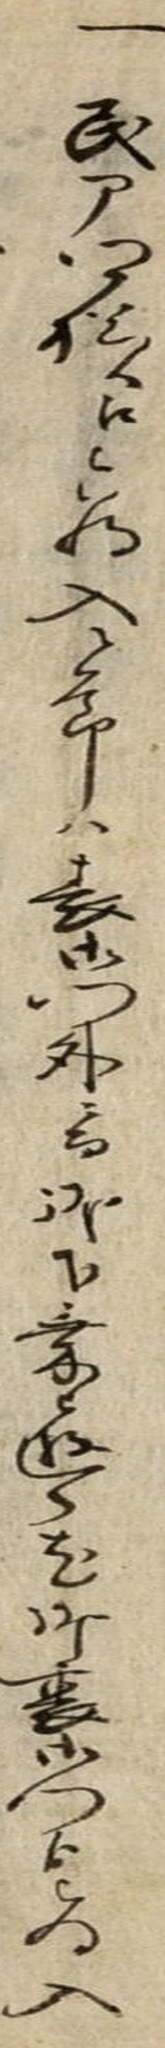一民部卿様江被為入候節は表御門外にて御下乗被遊候尤御裏御門ゟ被為入
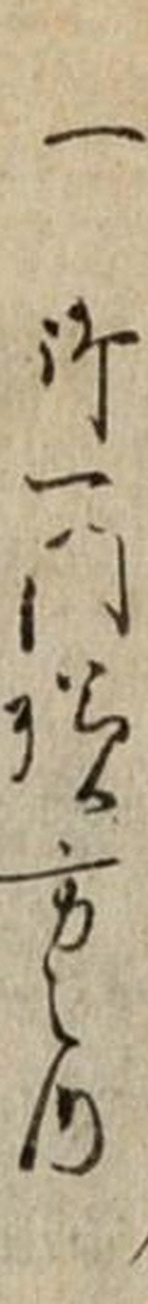一御一門様方之内
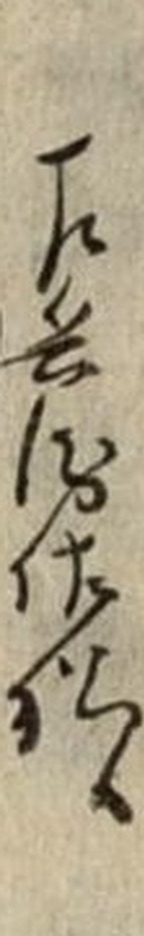左兵衛佐様
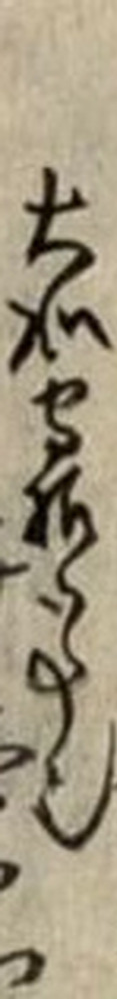大和守様御事也
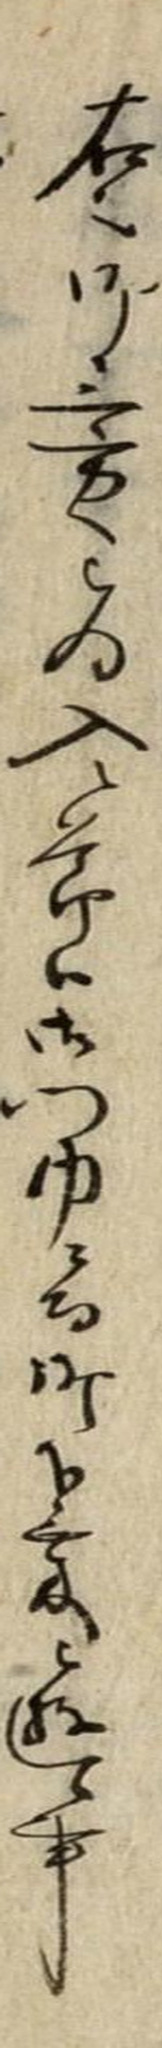右之御三方へ被為入候節は御門内にて御下乗被遊候事
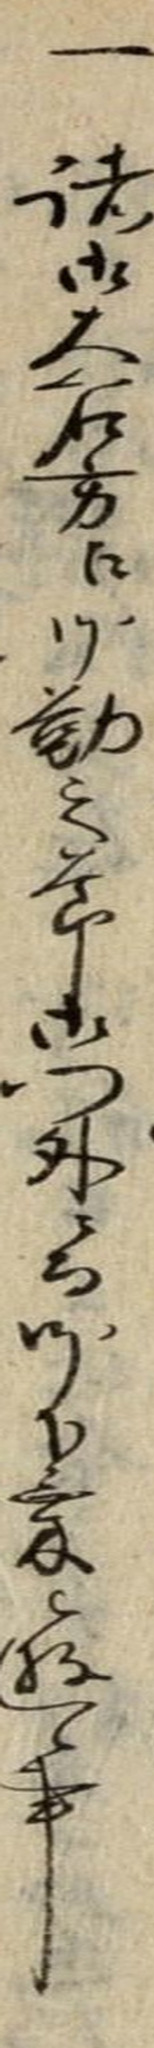一諸御大名方江御勤之節御門外にて御下乗被遊候事
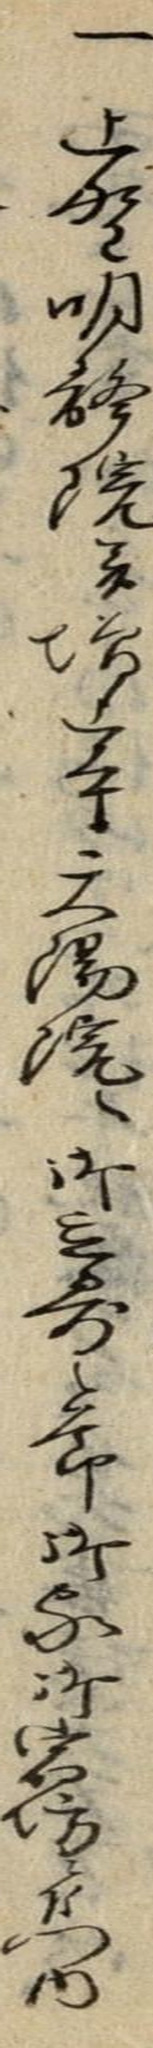一上野明静院并増上寺天陽院へ御立寄之節御家御宿坊に付門内
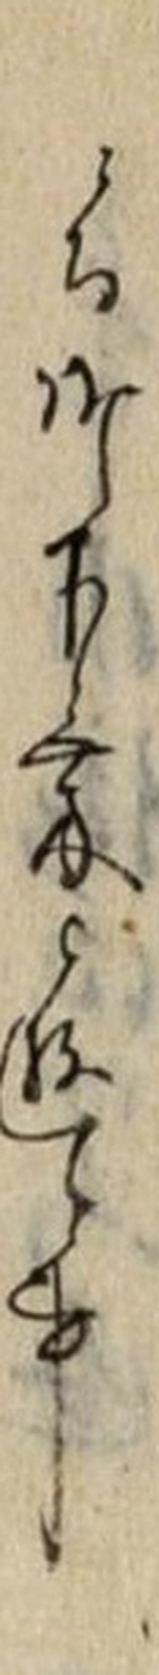にて御下乗被遊候事
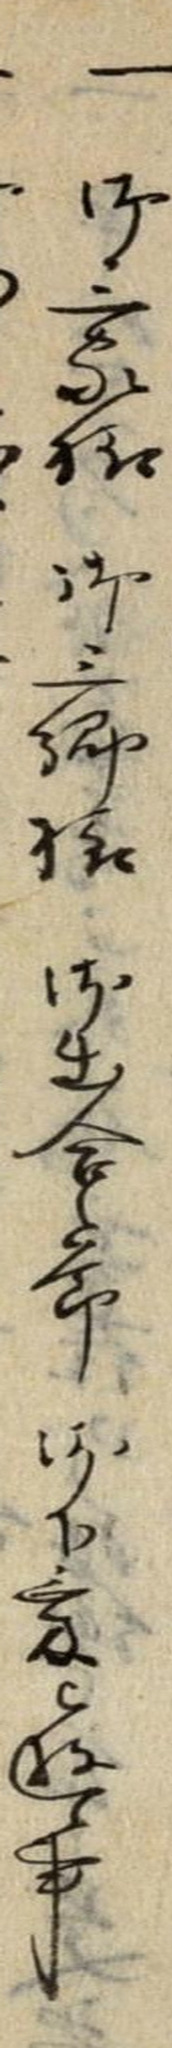一御三家様御三卿様御出合之節御下乗被遊候事
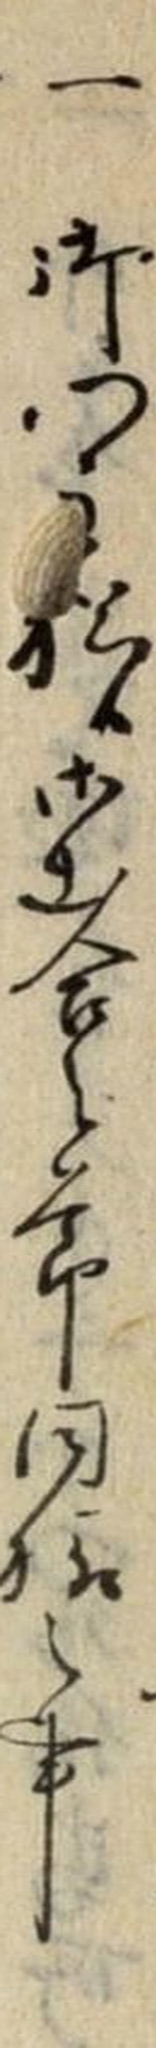一御門主様御出合之節同様之事
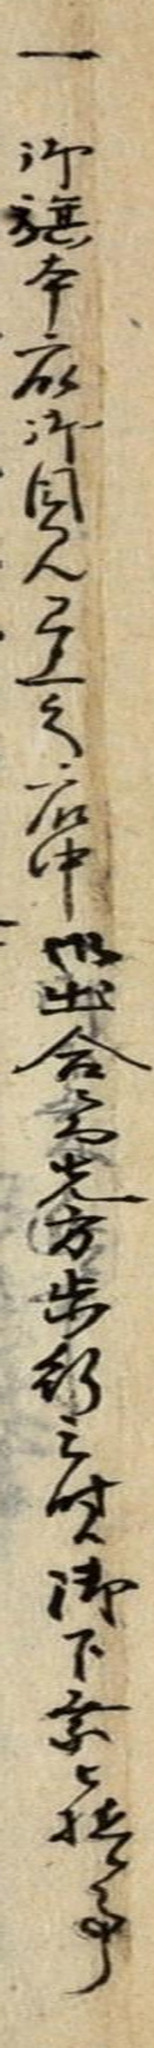一御旗本衆御目見已上之衆中御出合にて先方歩行之時は御下乗被遊候事
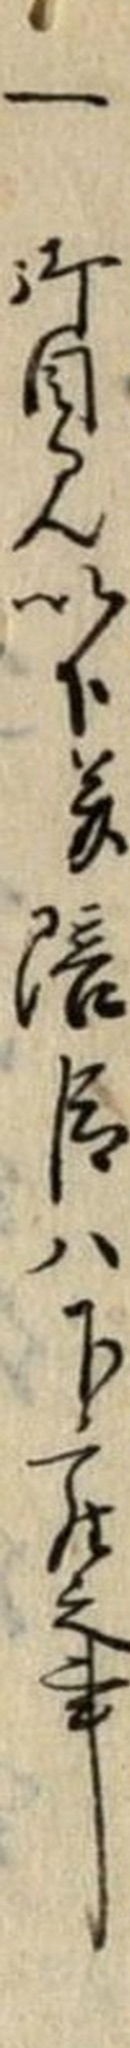一御目見以下并陪臣は下座之事
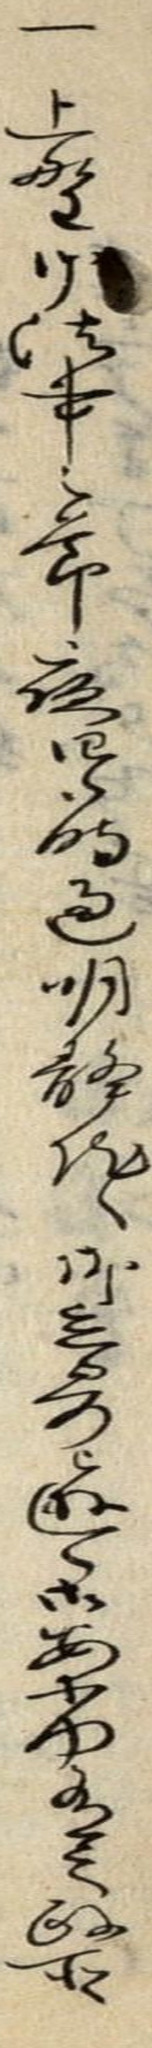一上野御法事之節夜四ツ時過明静院へ御立寄被遊候御案内有之政所へ
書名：三都并道中之部
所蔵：福井県文書館 Fukui Prefectural Archives
